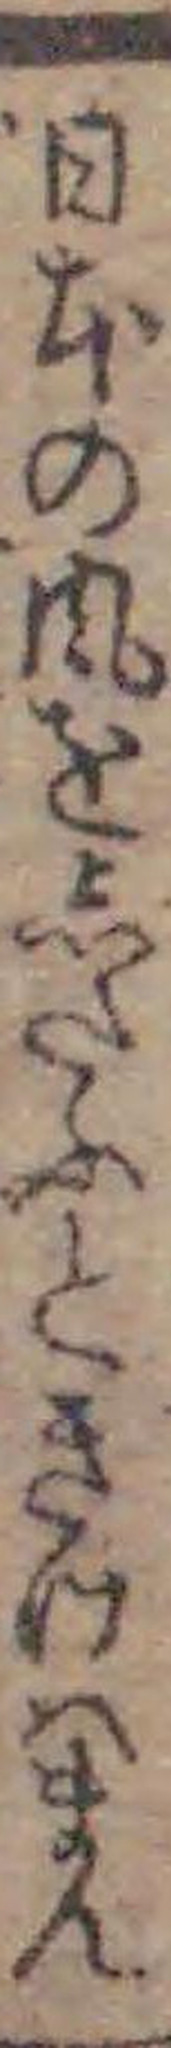日本の風をしたふときけはまん
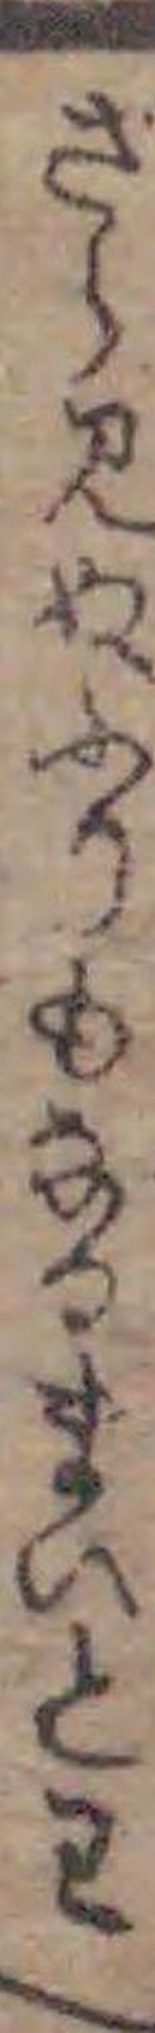ざら見ぬふりもなるまいとわ
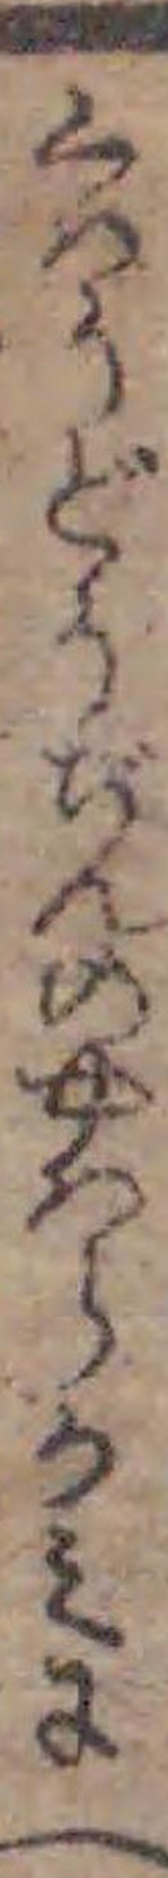くはかどうぢんのやはらかみに
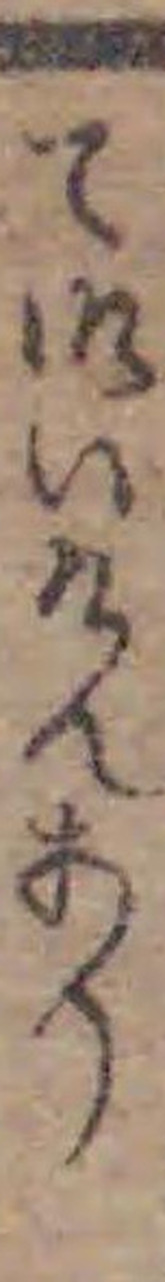て御いけんあり

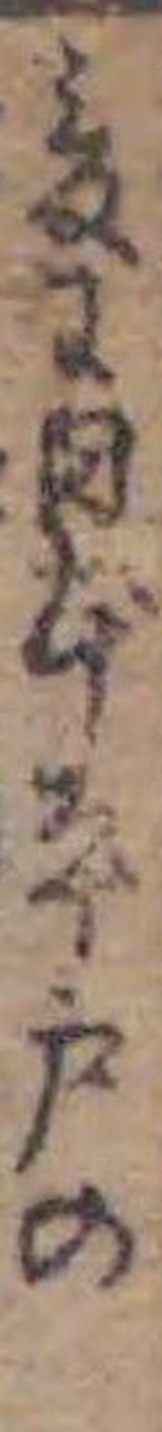爰に日本平戸の
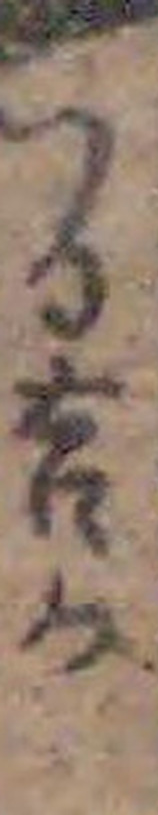つる吉か
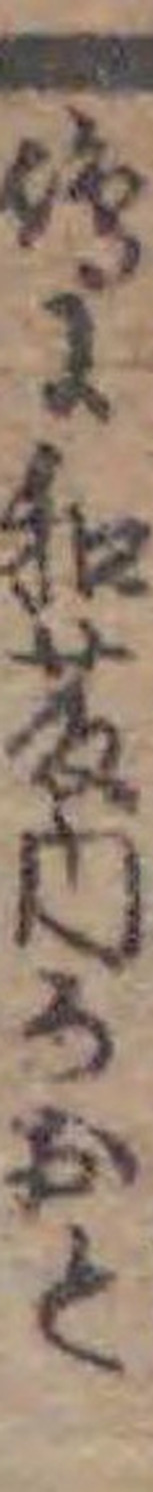嶋に和藤内かおと
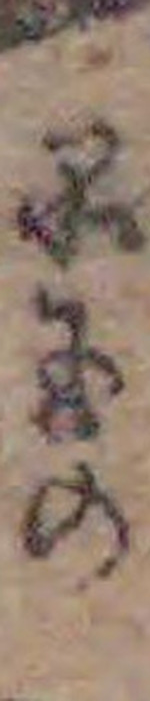品玉の
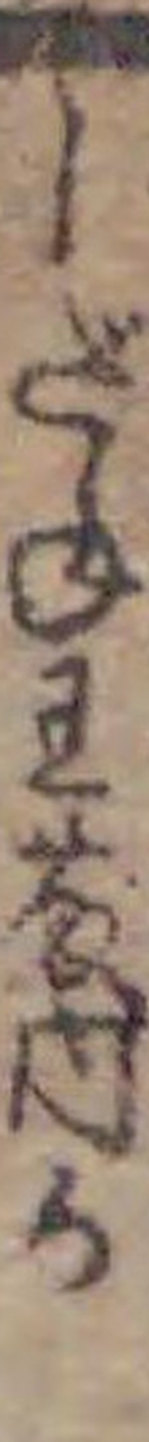しだね王藤内か
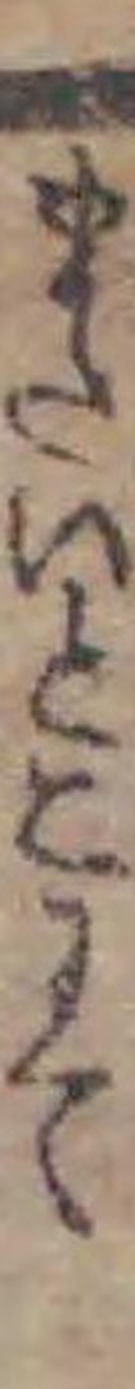またいとこにて
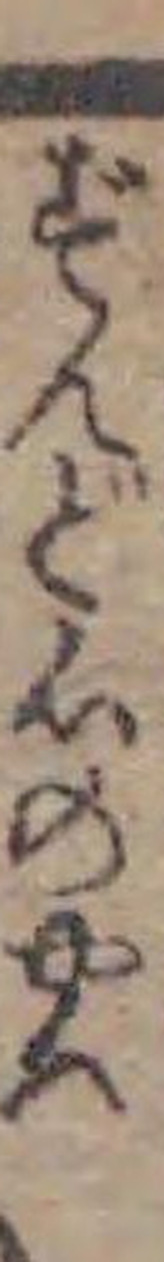ずんど心のやは
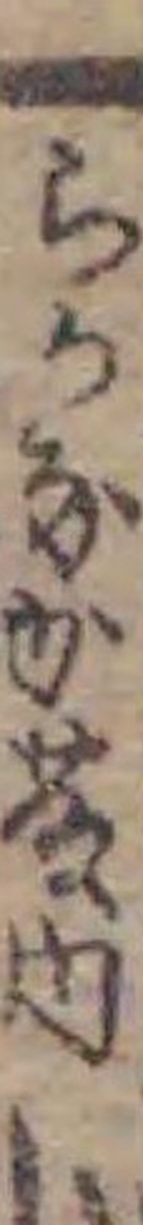らかな加藤内
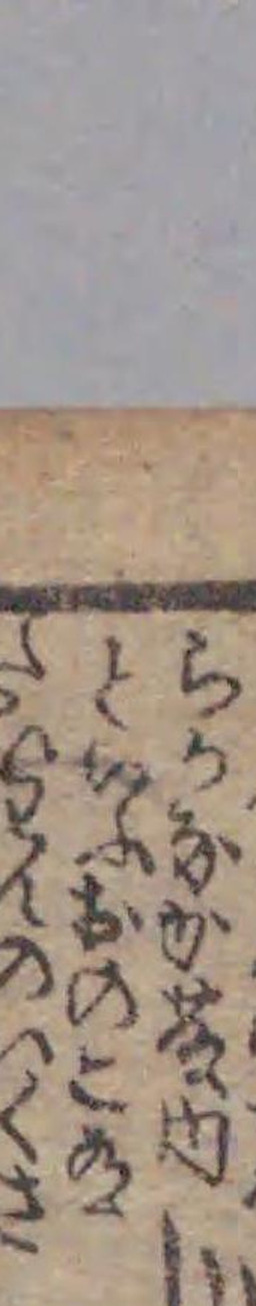といふおのこ有
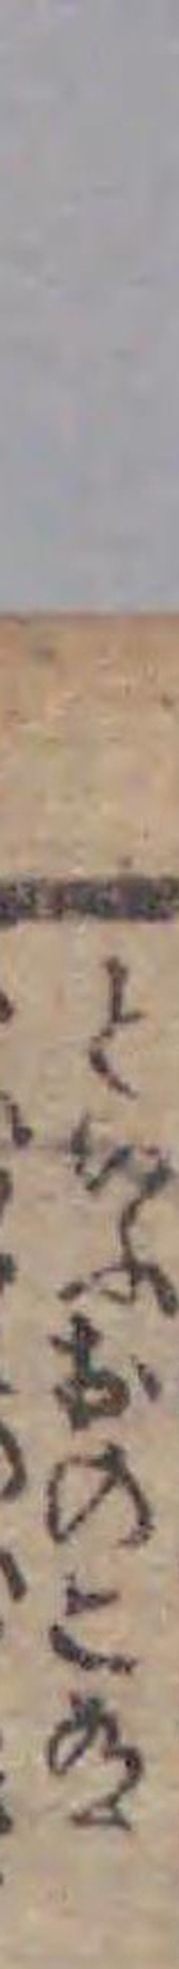といふおのこ有
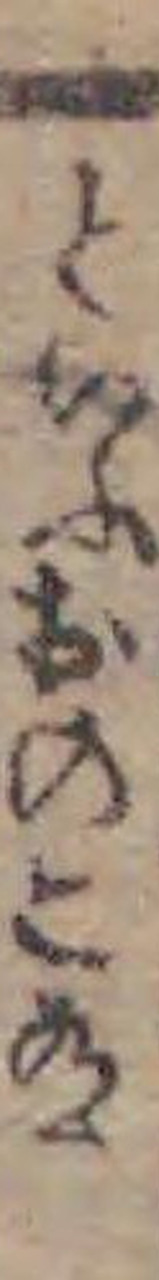といふおのこ有
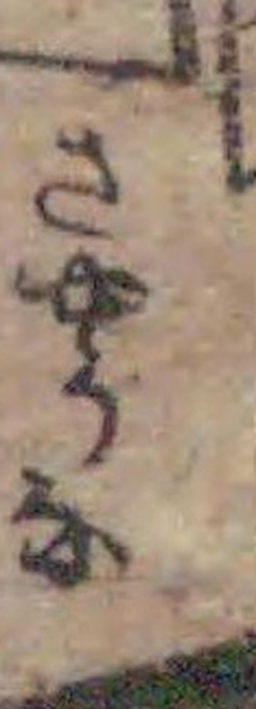さやうな
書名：此奴和日本 : 2巻
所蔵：国立国会図書館 National Diet Library, JAPAN
